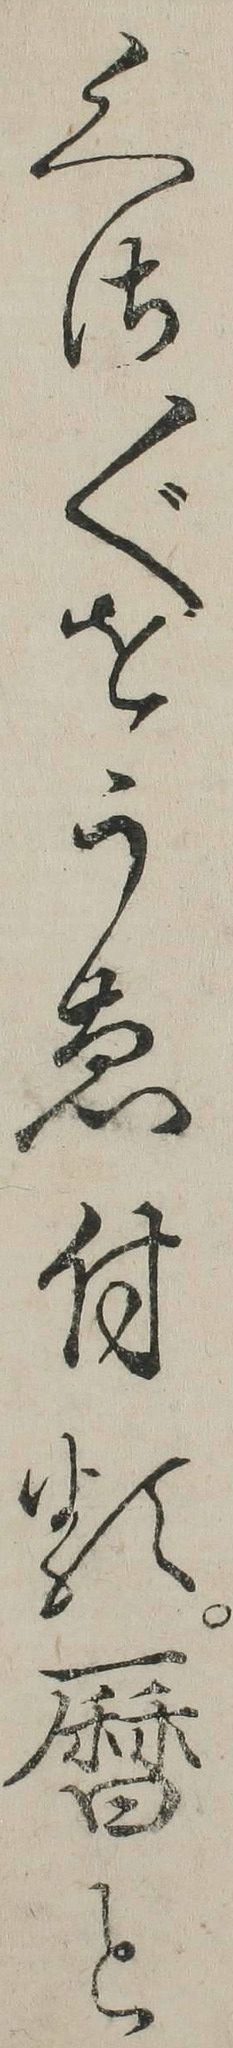くさ〴〵をうゑ付る。暦と
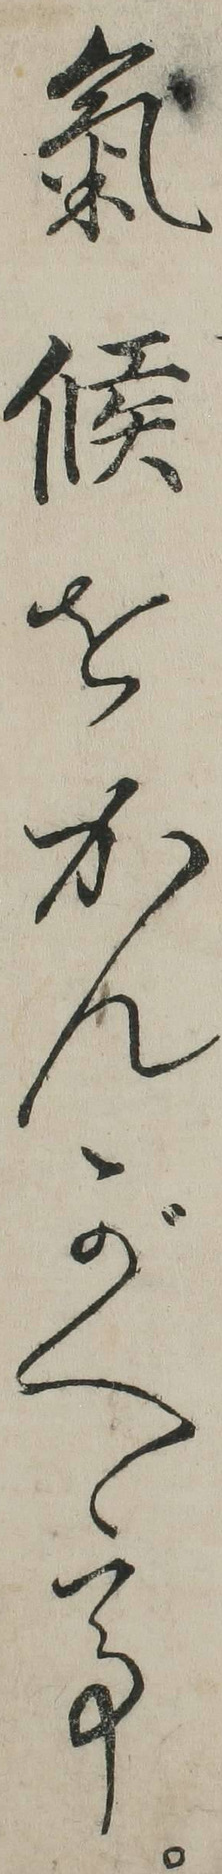気候をかんがへて
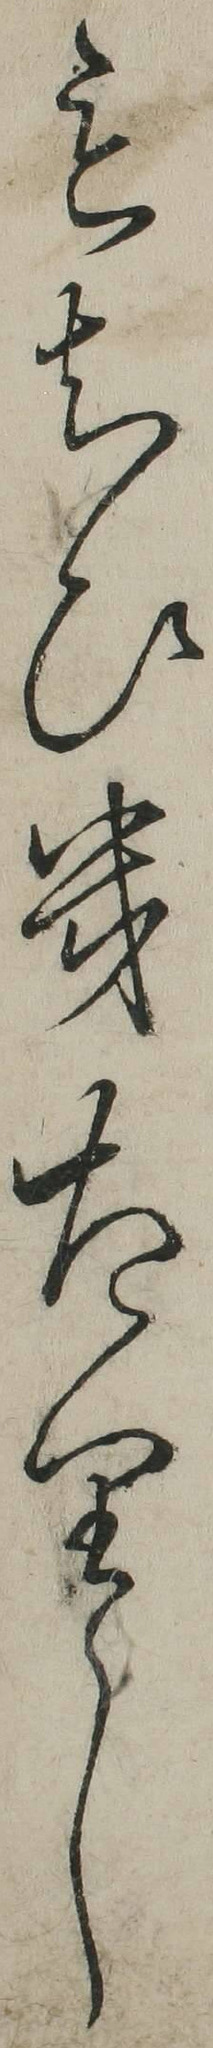もちひきたりし

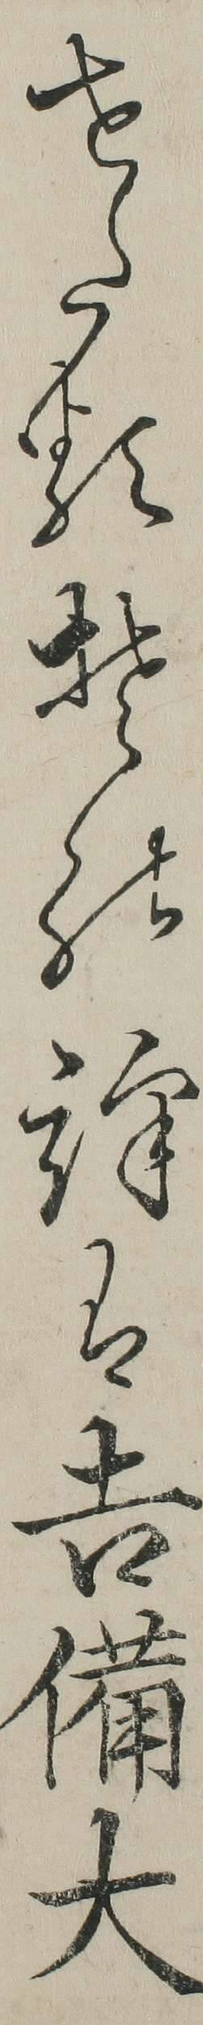せたるその訳は。吉備大
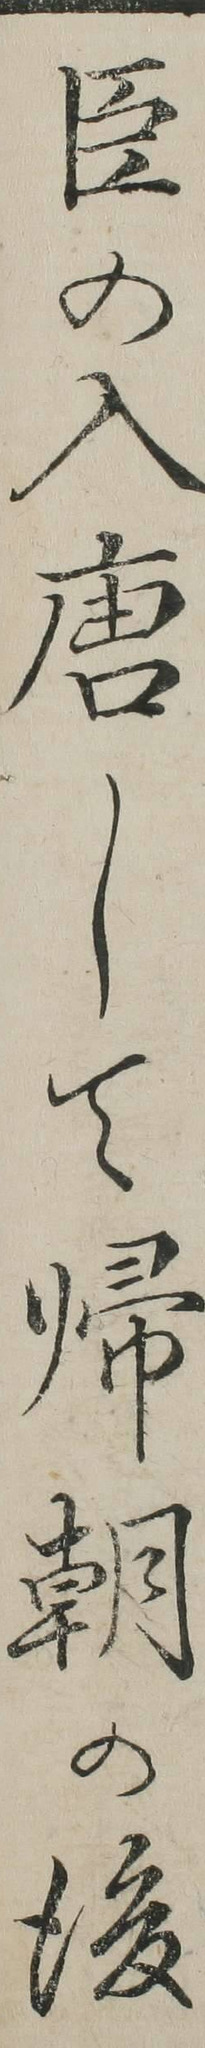臣の入唐して。帰朝の後
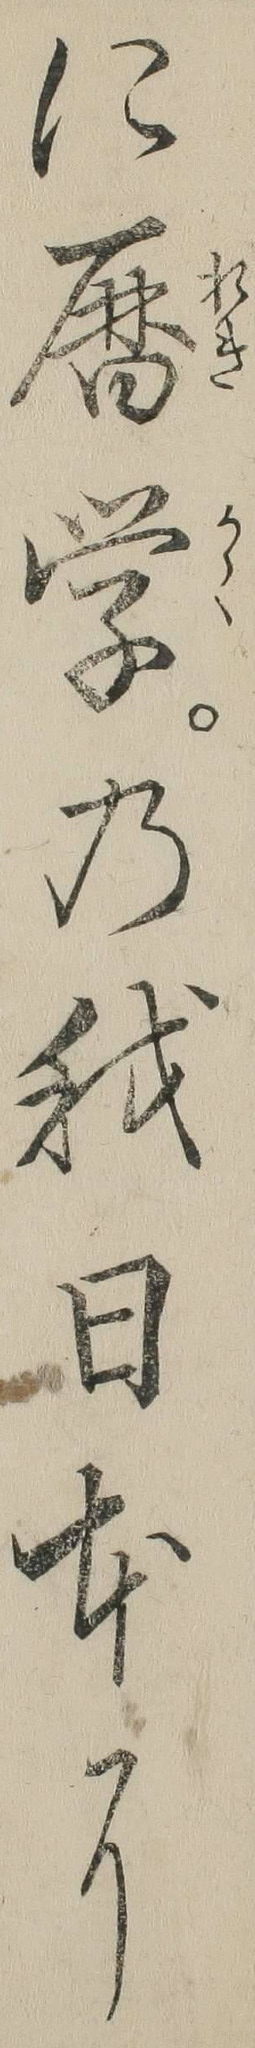に暦学。の我日本に
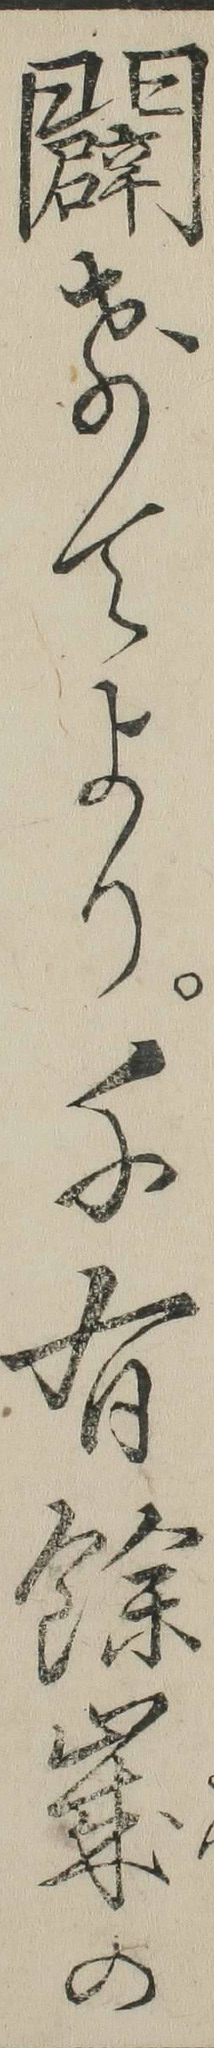闢けてより。千有余歳の
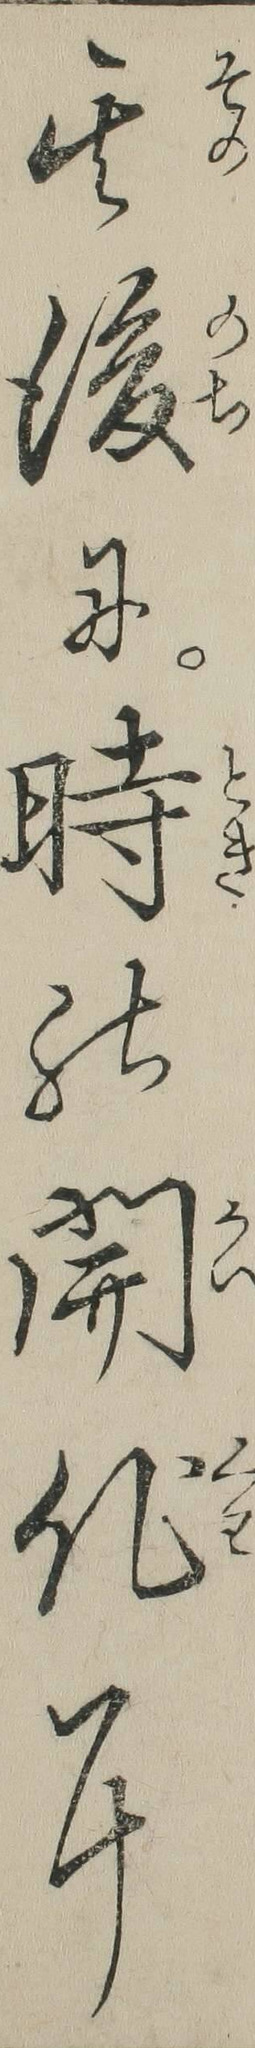其後に。時の開化に
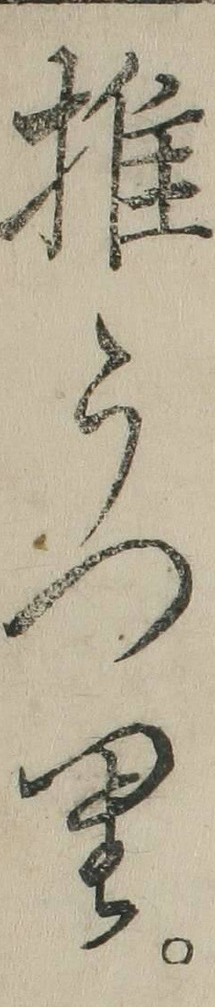推うつり。

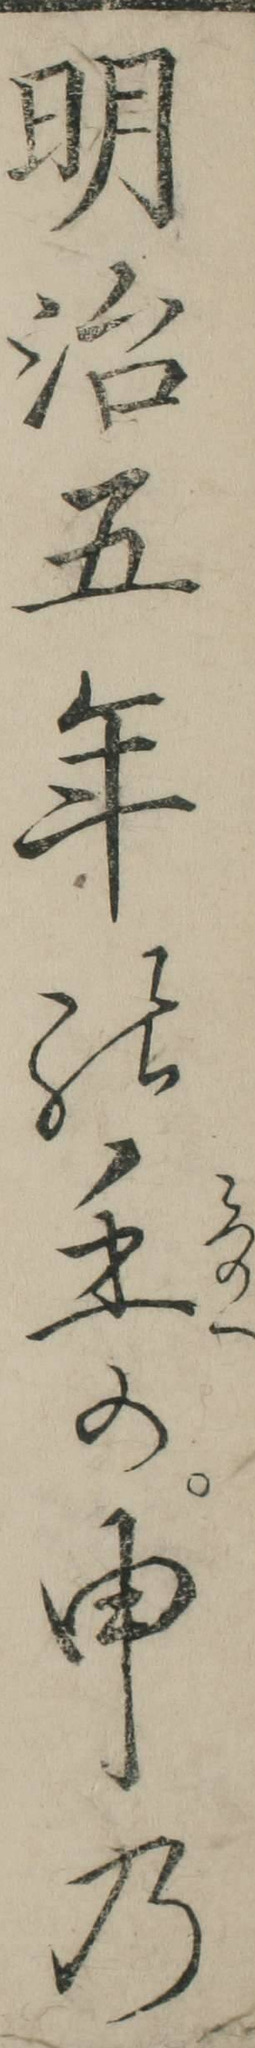明治五年の壬の。申の
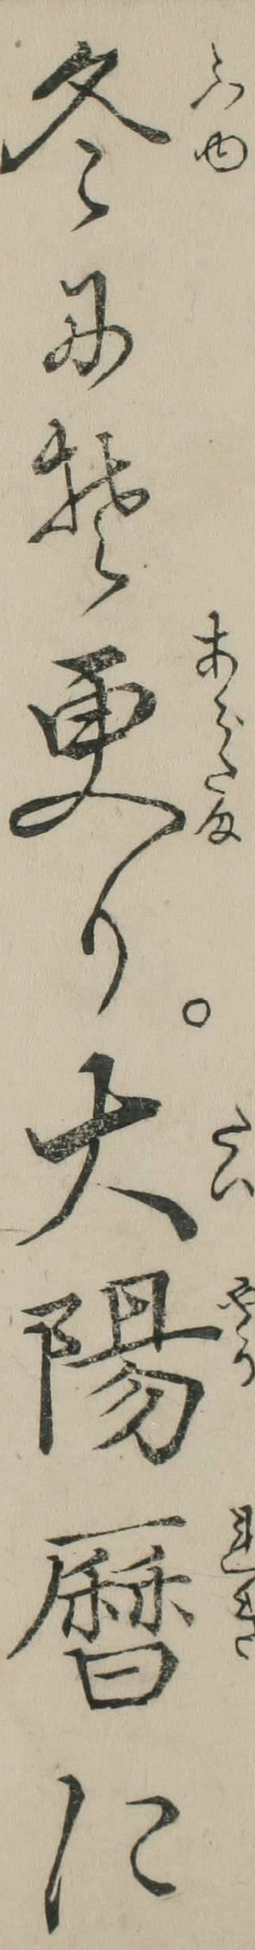冬にそ更り。太陽暦に
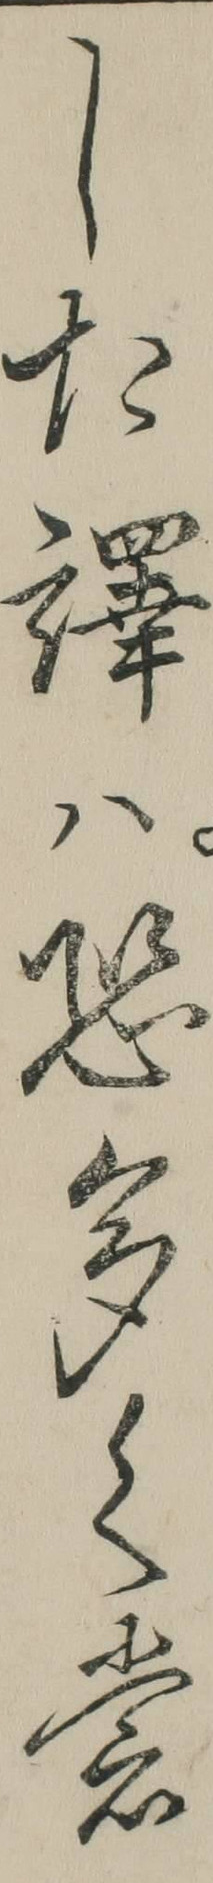した訳は。恐多くも
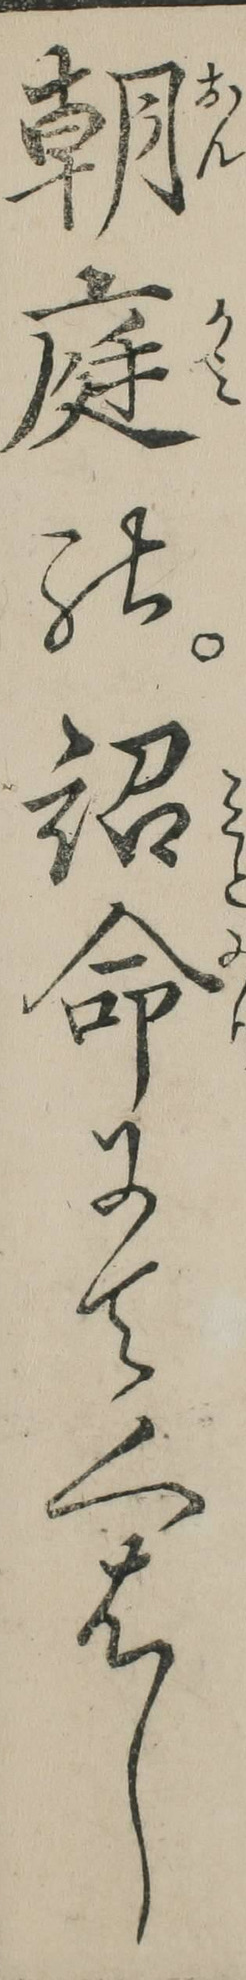朝庭の。詔命にてくはし
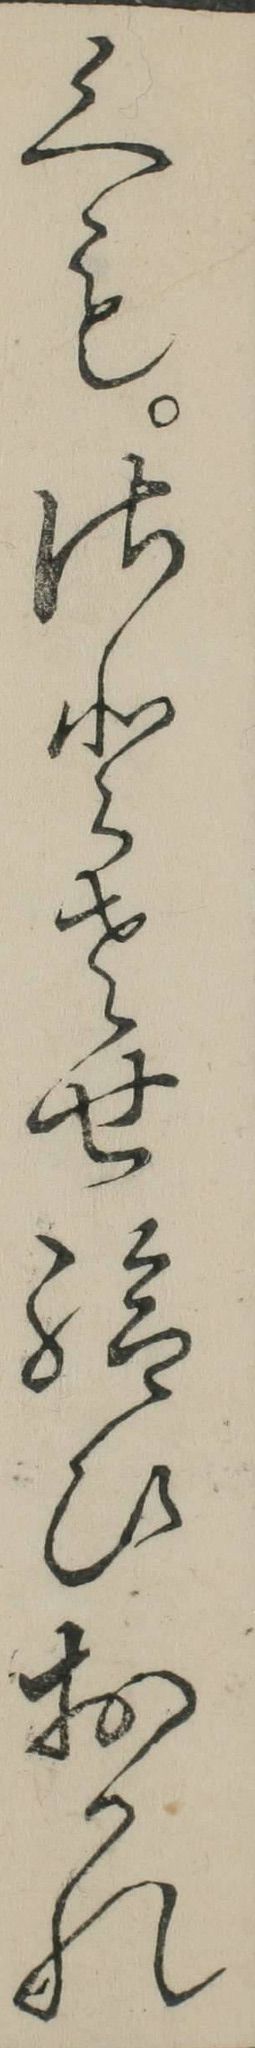くも。さとさせ給ひおかれ
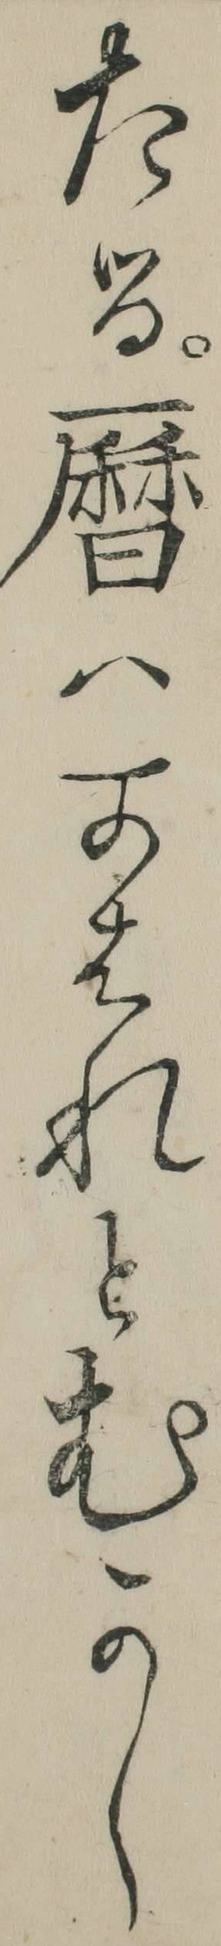たる。暦はかはれとむかし
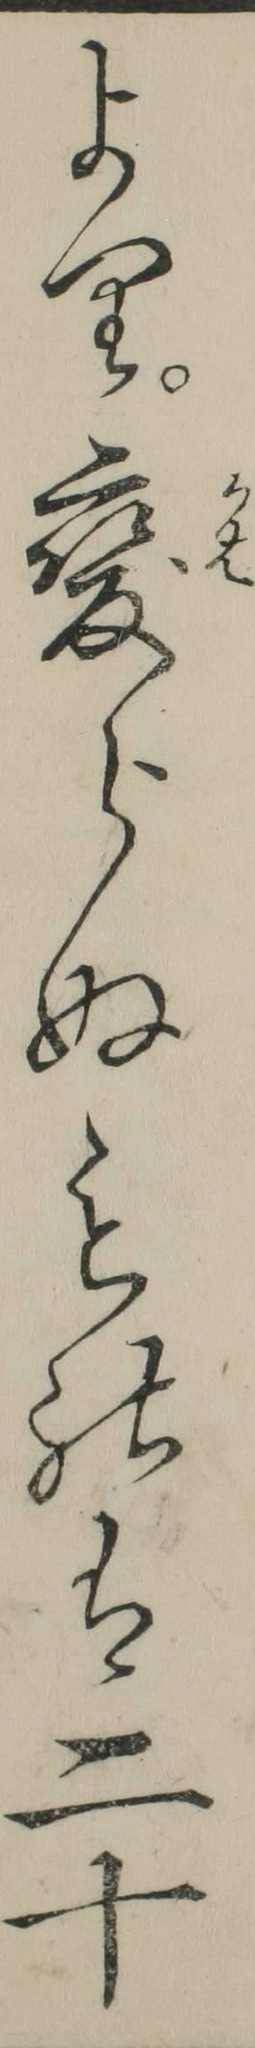より。変らぬものは二十
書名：農蠶必要日読往来
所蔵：東京学芸大学附属図書館 国文学研究資料館
